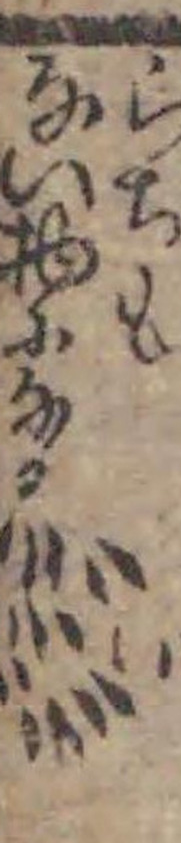ない物になる
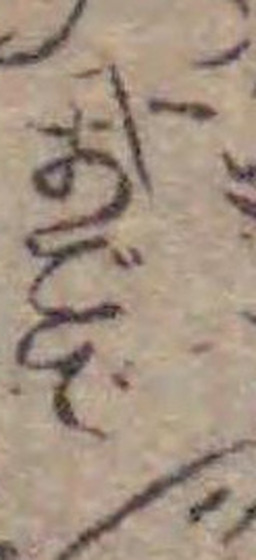〽あごで

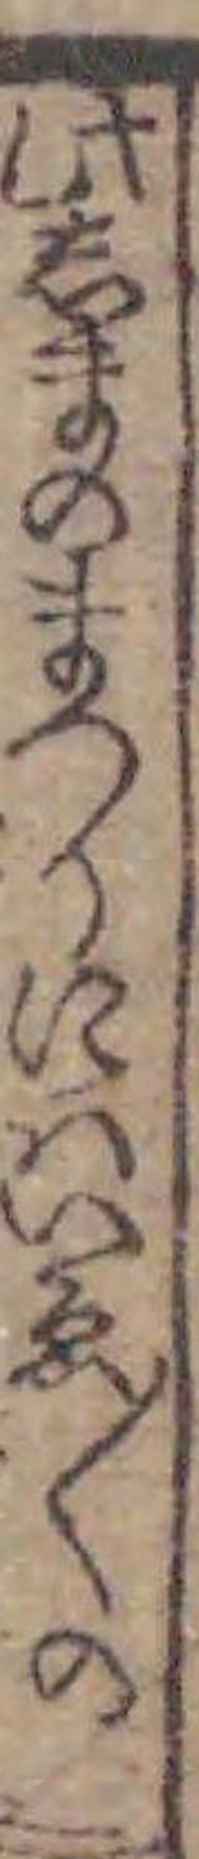此しまのまつりにはいゑ〳〵の
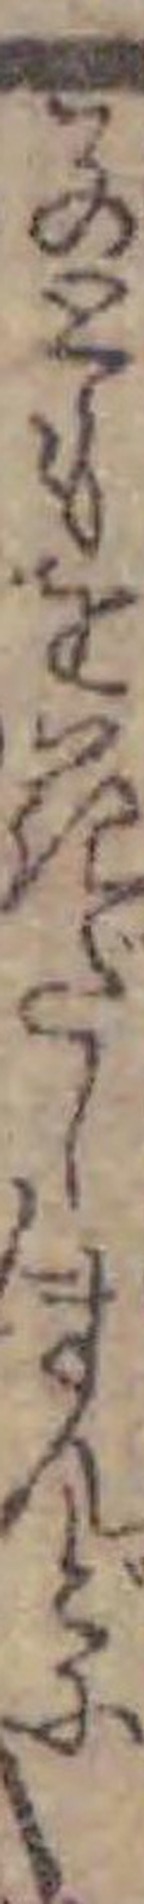子ともを花だしまんどに
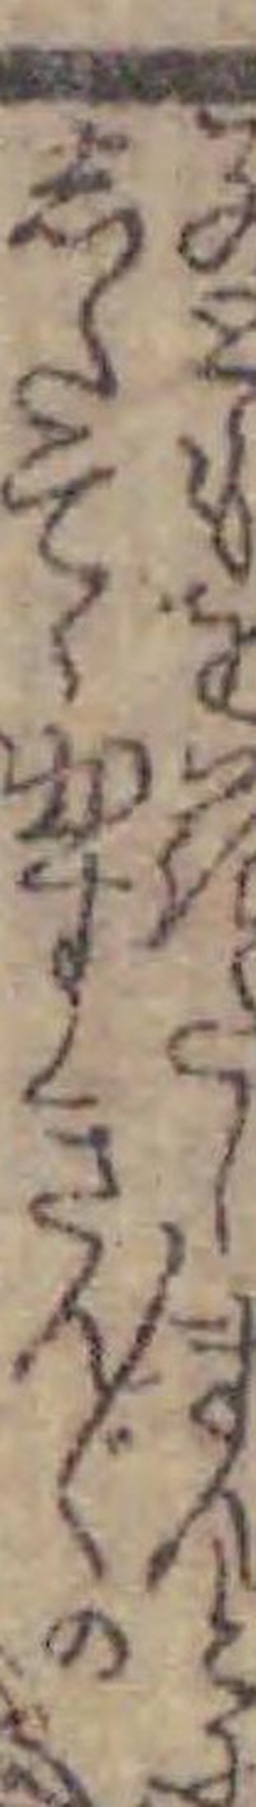したてゝ出すきん〴〵の
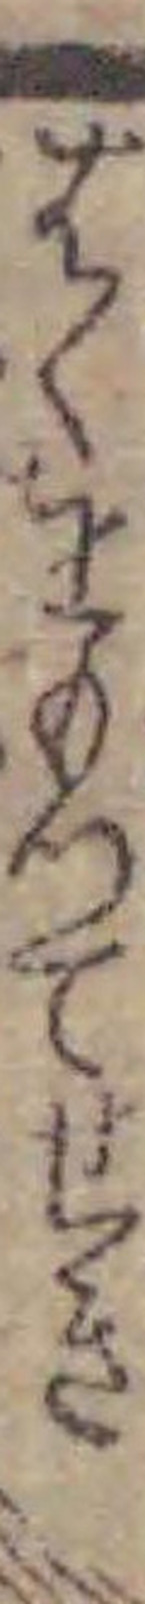はくをもつてせき
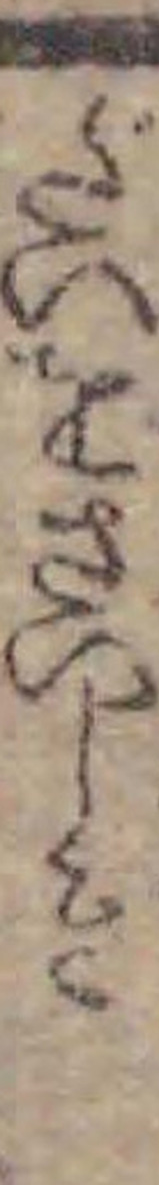だいをさいしき
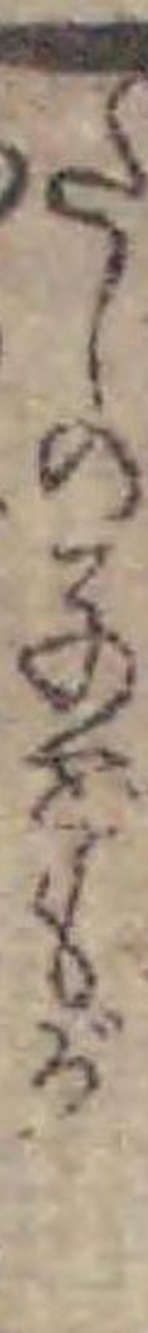だしの子どもが
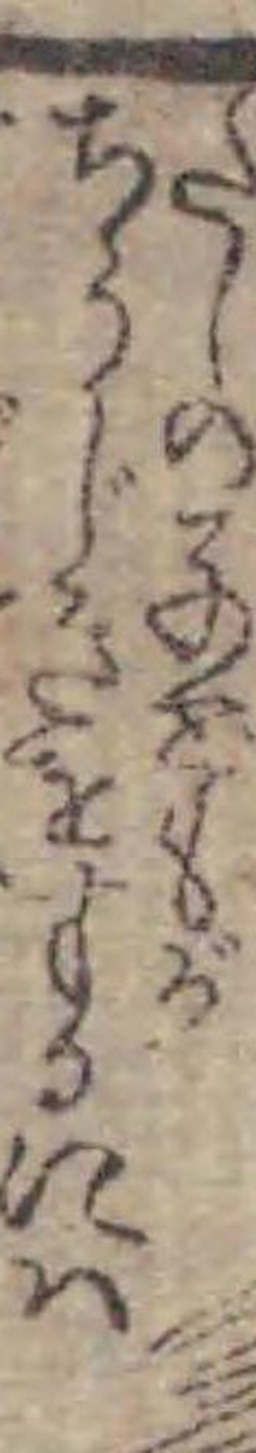ちうじきをするうには
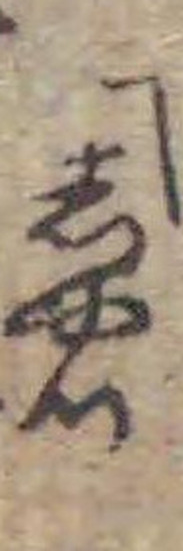〽しやつ
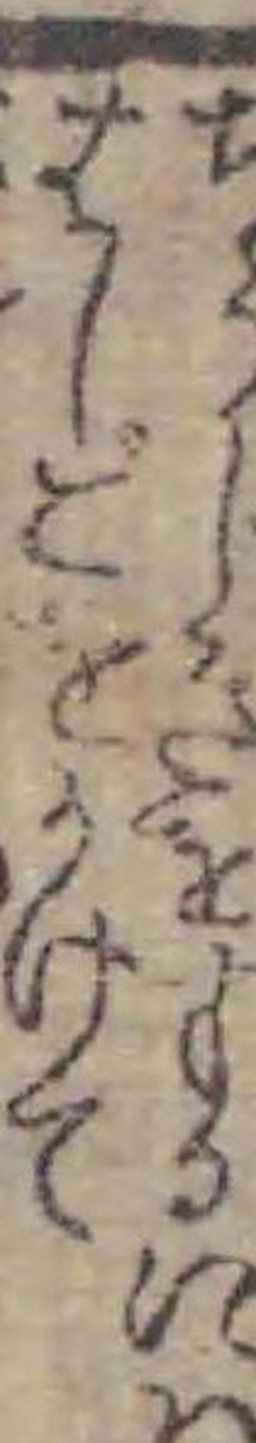はしごをかけて
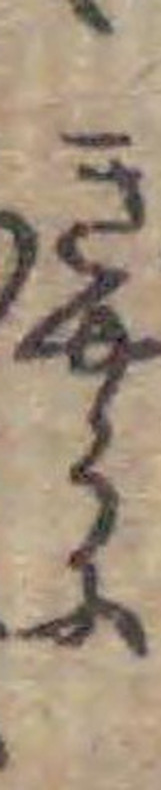きやうに
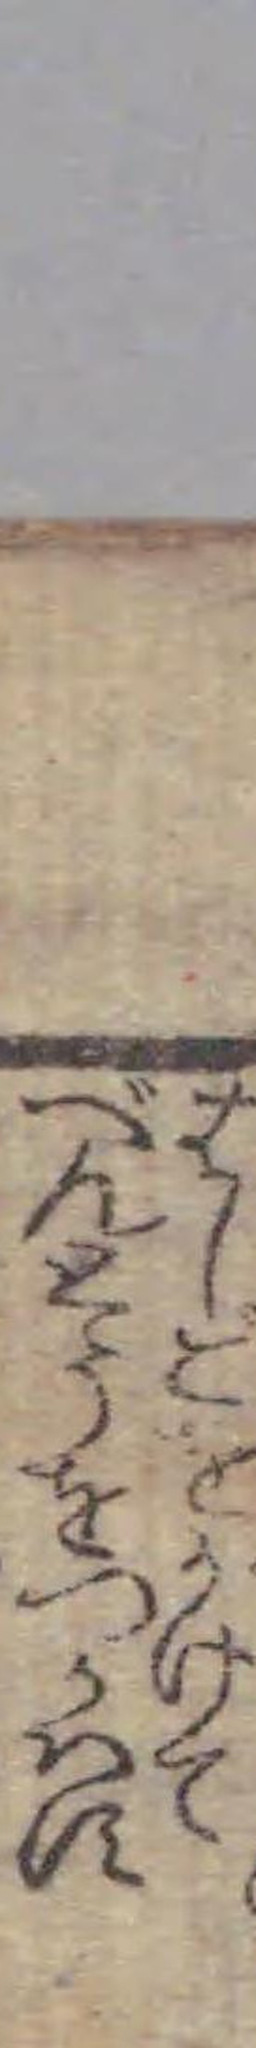べんとうをつかはす
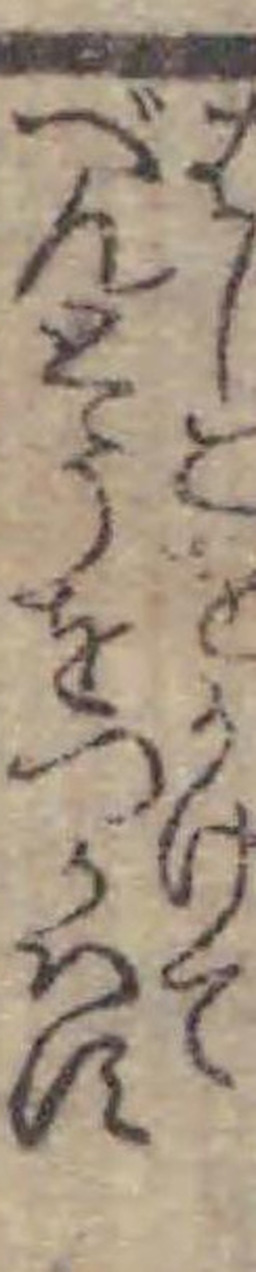べんとうをつかはす
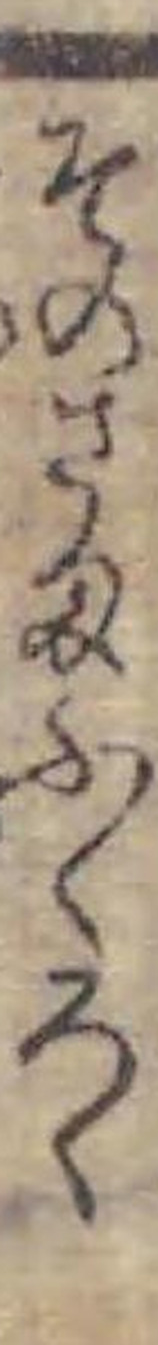そのさまふくろく
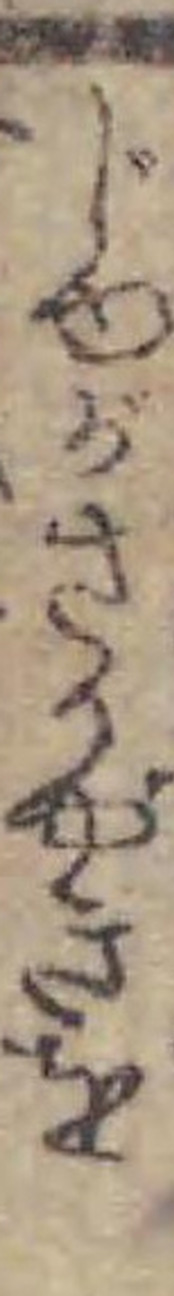じゆがさかやきを
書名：奇妙頂礼胎錫杖 : 3巻
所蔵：国立国会図書館 National Diet Library, JAPAN
